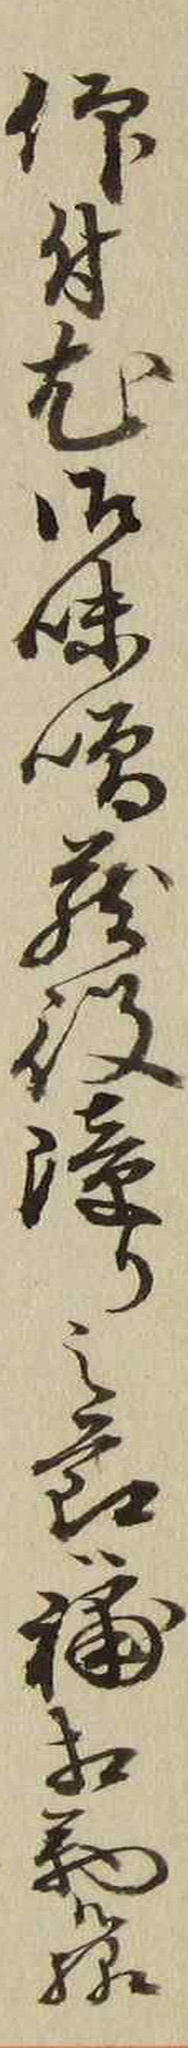仰付尤御味噌藏役障り之節ハ補相勤候様
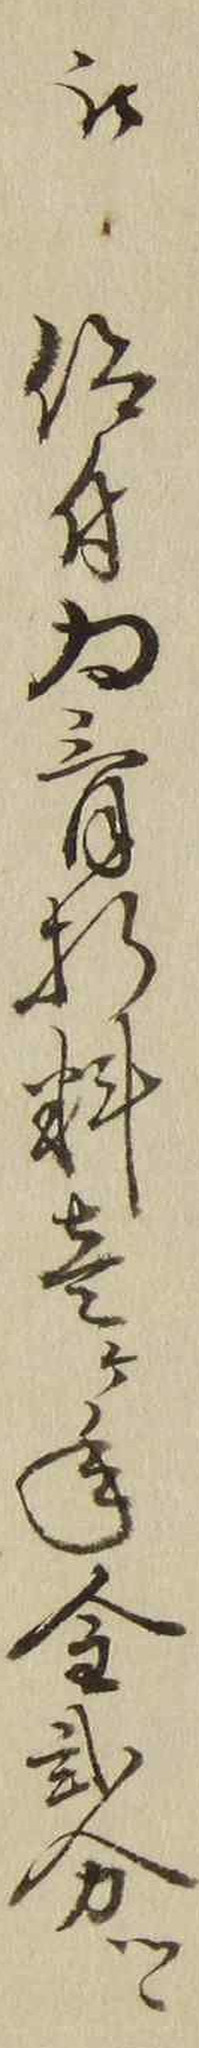被仰付為骨折料壱ケ年金弐分ツヽ

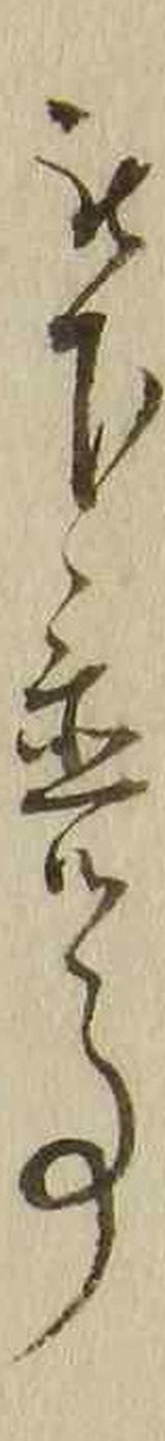被下置候事
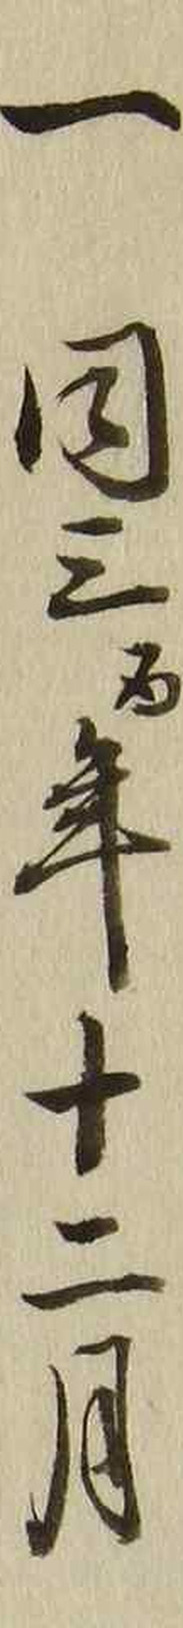一同三酉年十二月
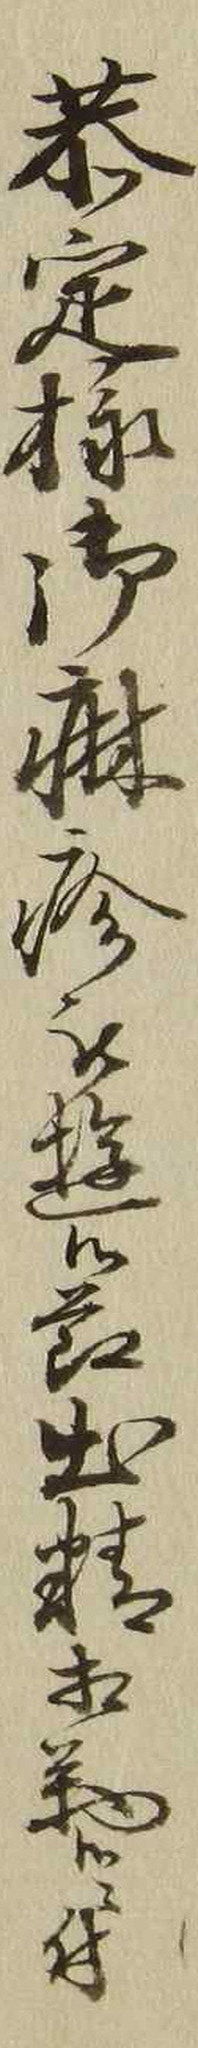恭定様御痳疹被遊候節出精相勤候ニ付
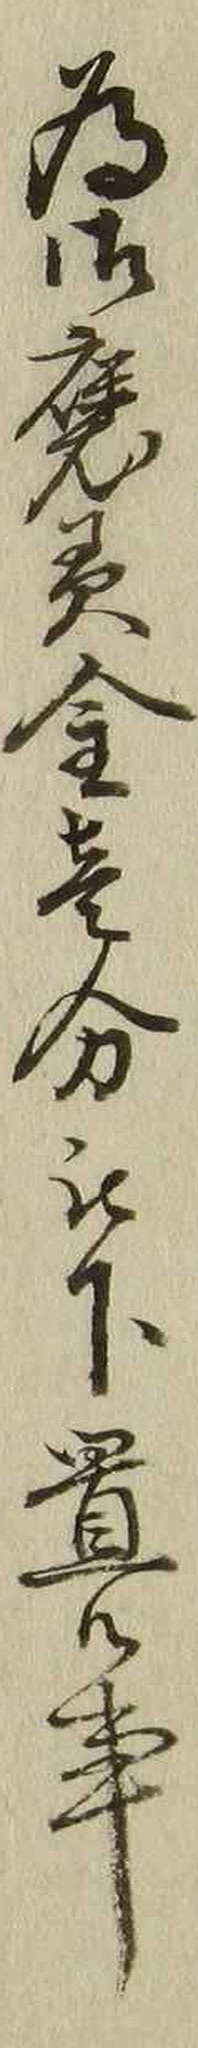為御褒美金壱分被下置候事
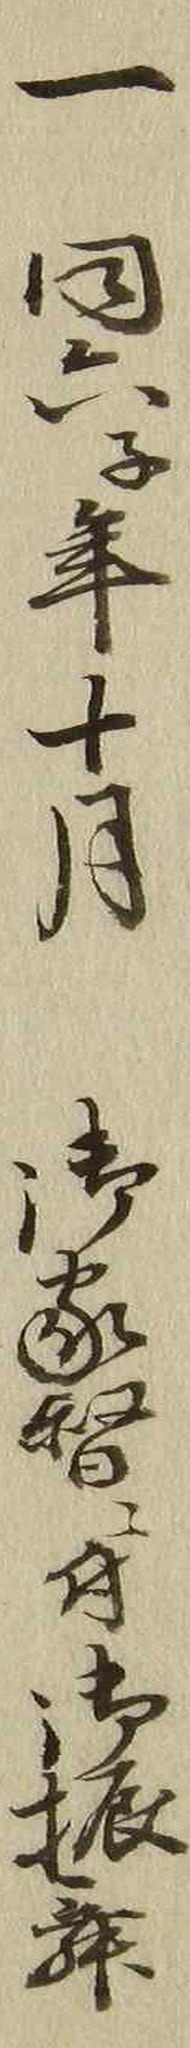一同六子年十月御家督ニ付御振舞
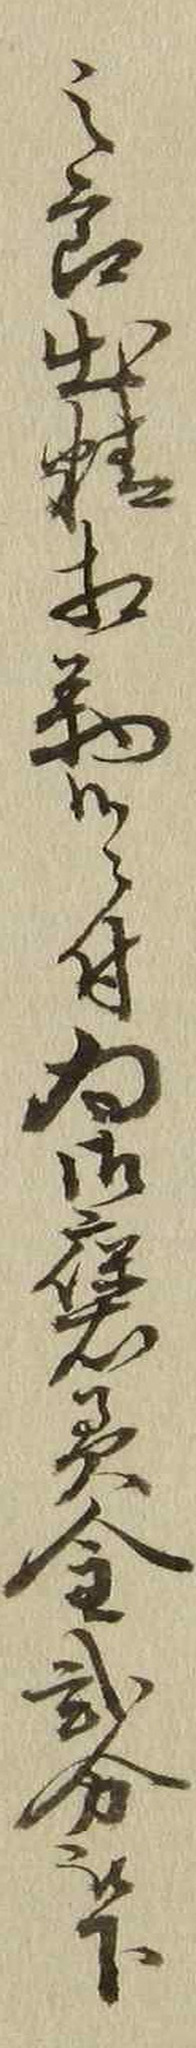之節出精相勤候ニ付為御褒美金弐分被下
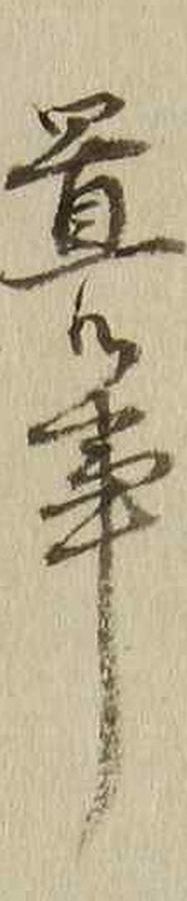置候事
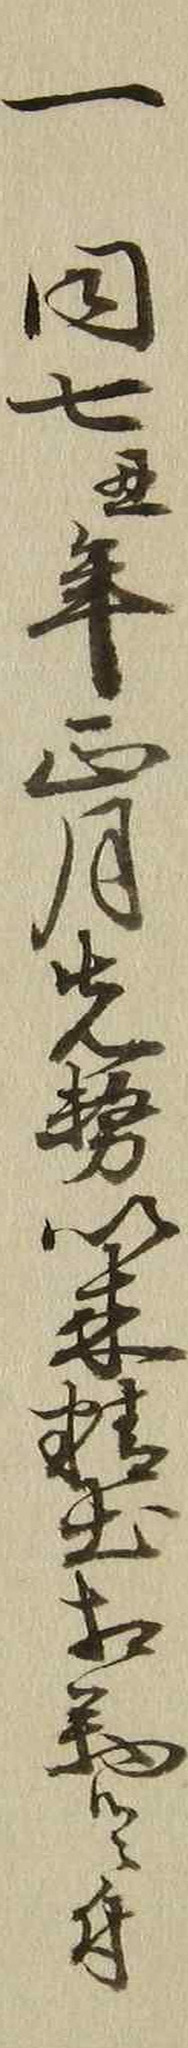一同七丑年正月先努以精出相勤候ニ付
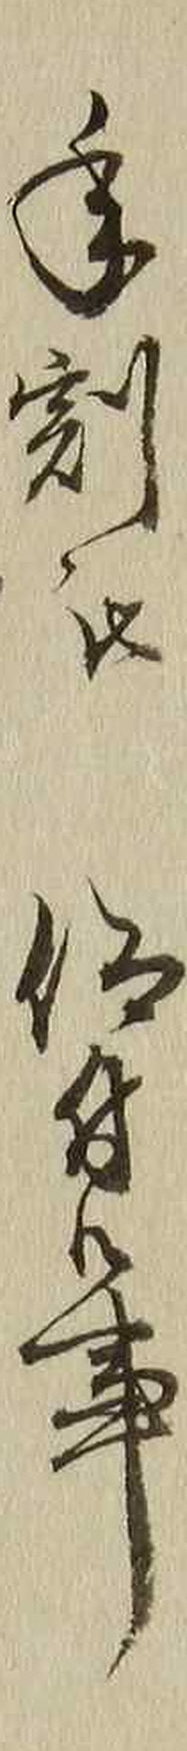年割被仰付候事
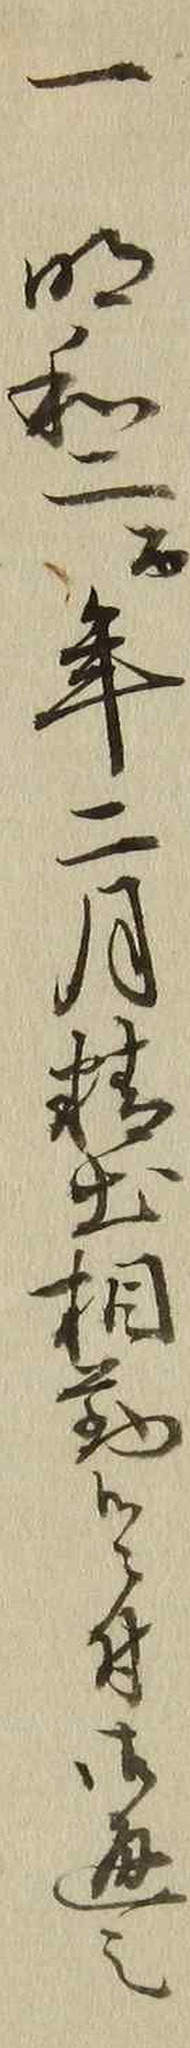一明和二酉年二月精出相勤候ニ付御通之
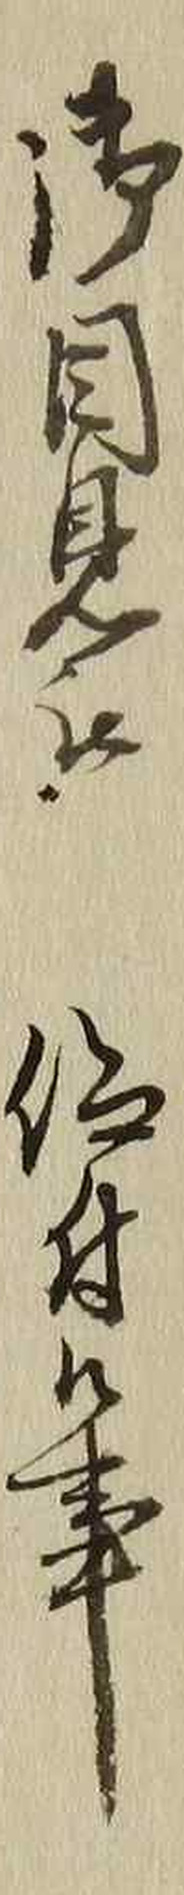御目見被仰付候事
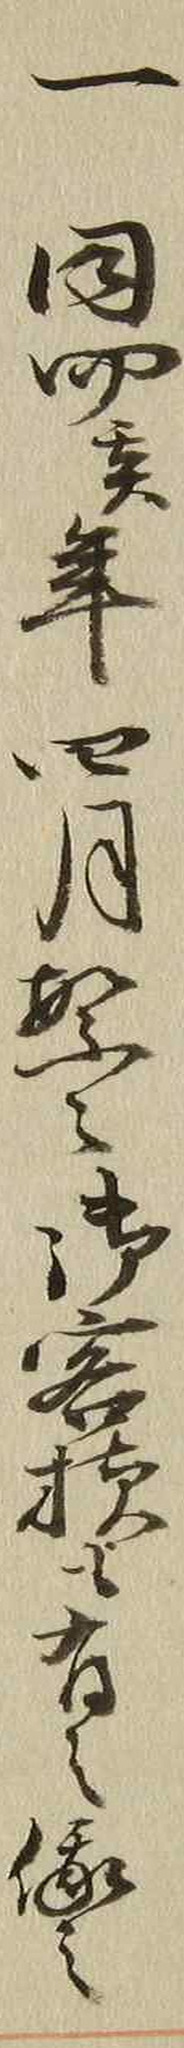一同四亥年四月繫之御客様も有之俄之
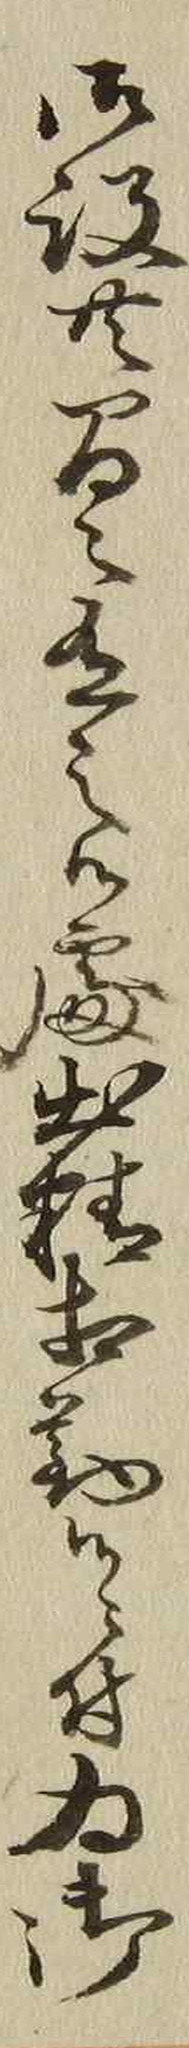御役共間ニ有之候處出精相勤候ニ付為御
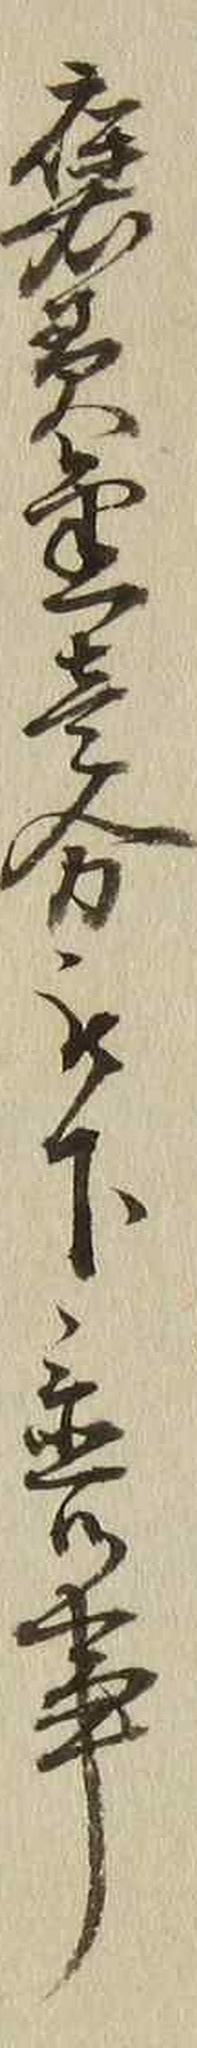褒美金壱分被下置候事
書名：諸士系譜　巻之64　と之部7
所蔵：会津若松市立会津図書館
